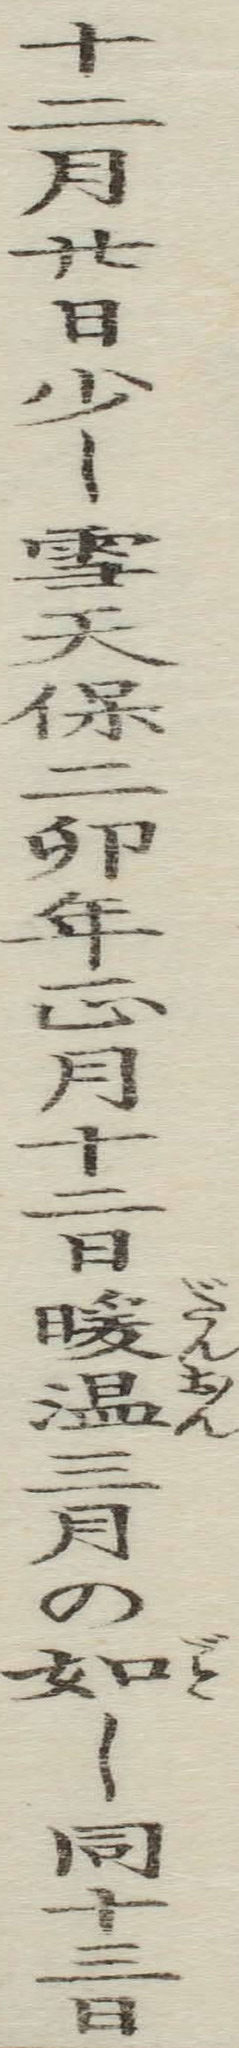十二月廿日少し雪天保二卯年正月十二日暖温三月の如し同十三日
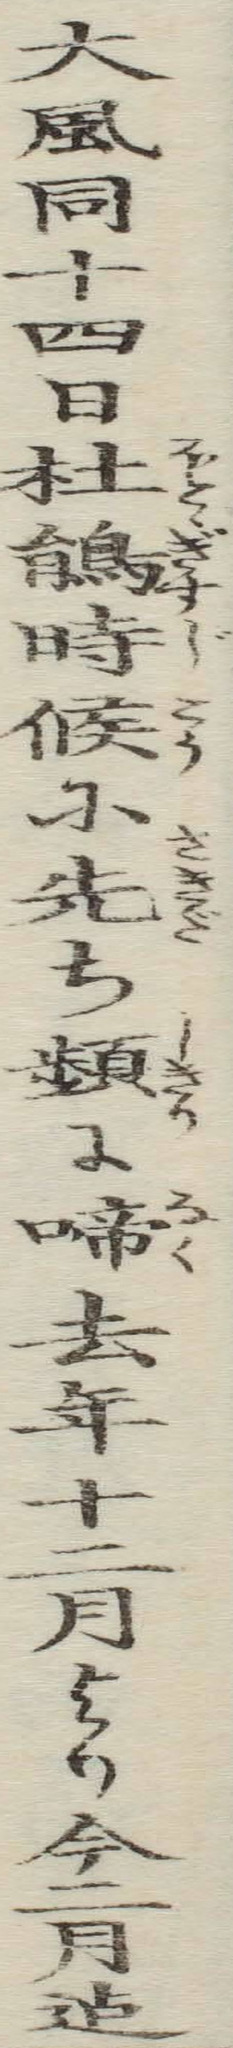大風同十四日杜䳌時候に先ち頻に啼去年十二月より今二月迄
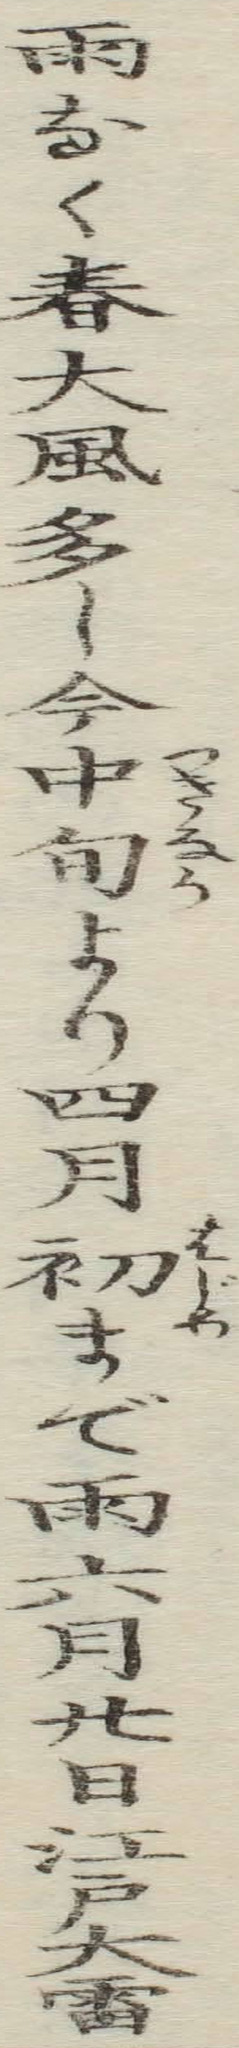雨なく春大風多し今中旬より四月初まで雨六月廿日江戸大雷
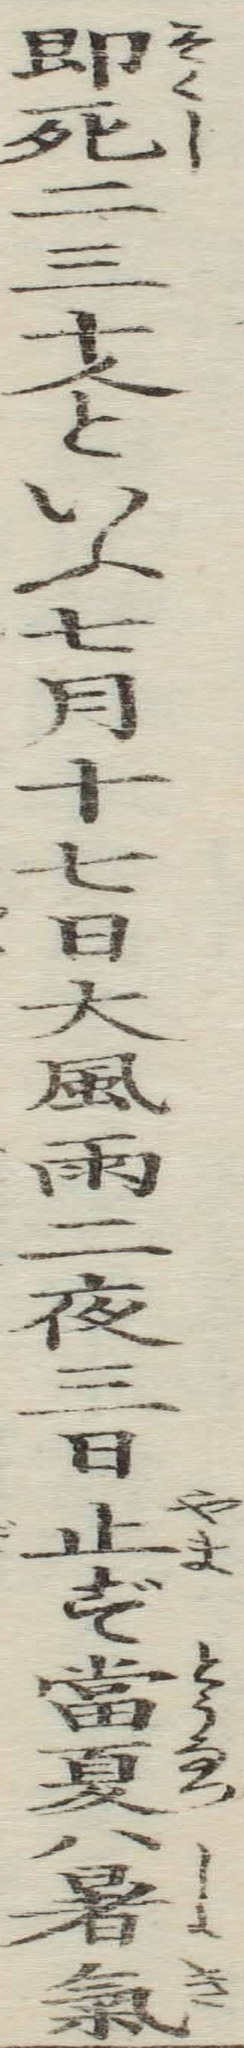即死二三十人といふ七月十七日大風雨二夜三日止ず当夏は暑気
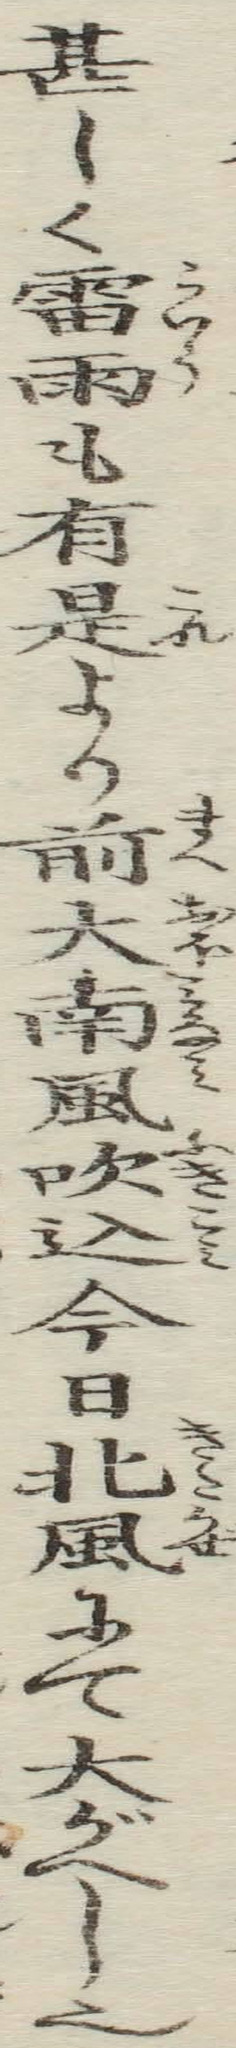甚しく雷雨も有是より前大南風吹込今日北風にて大がへし也
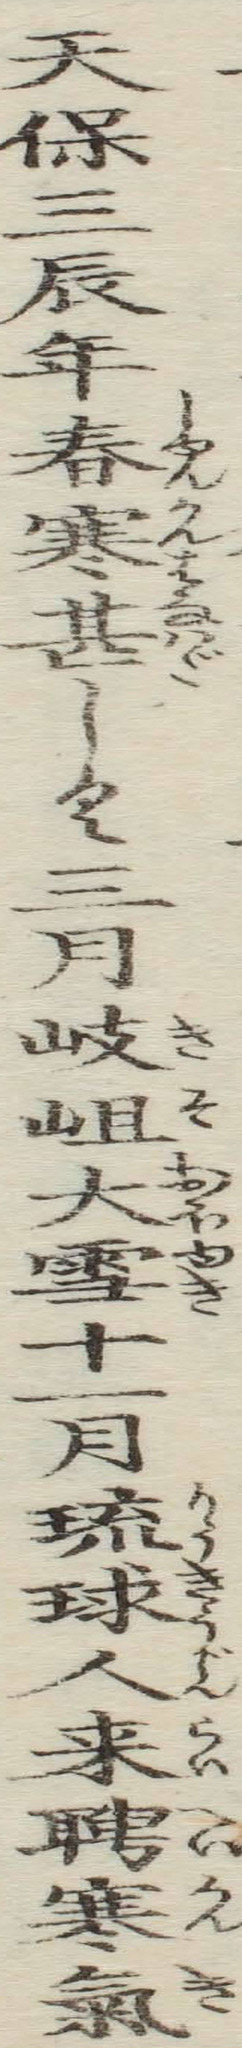天保三辰年春寒甚しく三月岐岨大雪十一月琉球人来聘寒気
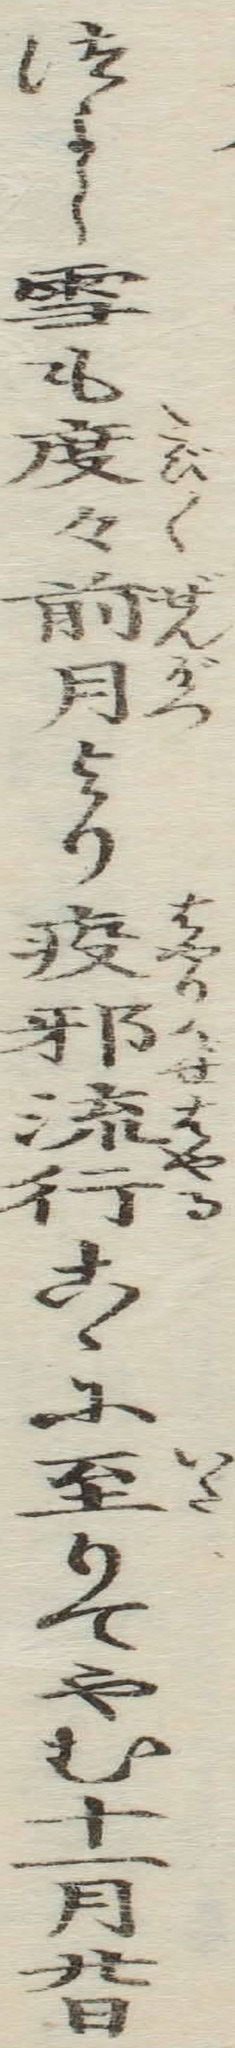つよし雪も度々前月より疫邪流行こゝに至りてやむ十一月廿日
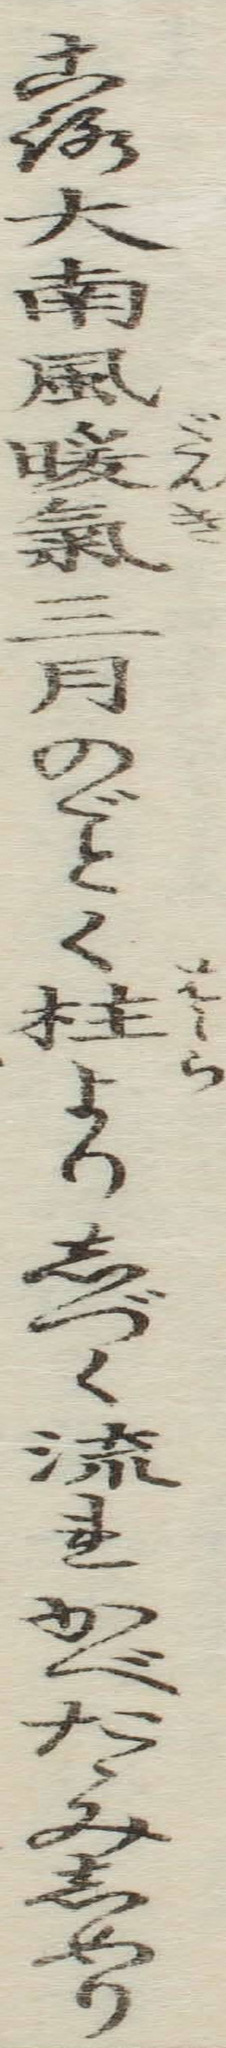ころ大南風暖気三月のごとく柱よりしづく流れかべたゝみしめり
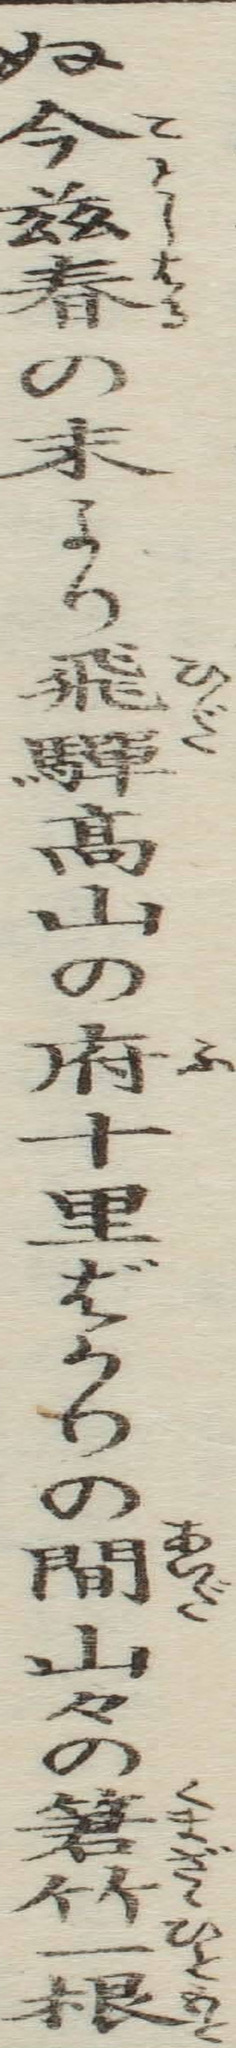ぬ今茲春の末より飛騨高山の府十里ばかりの間山々の䇹竹一根

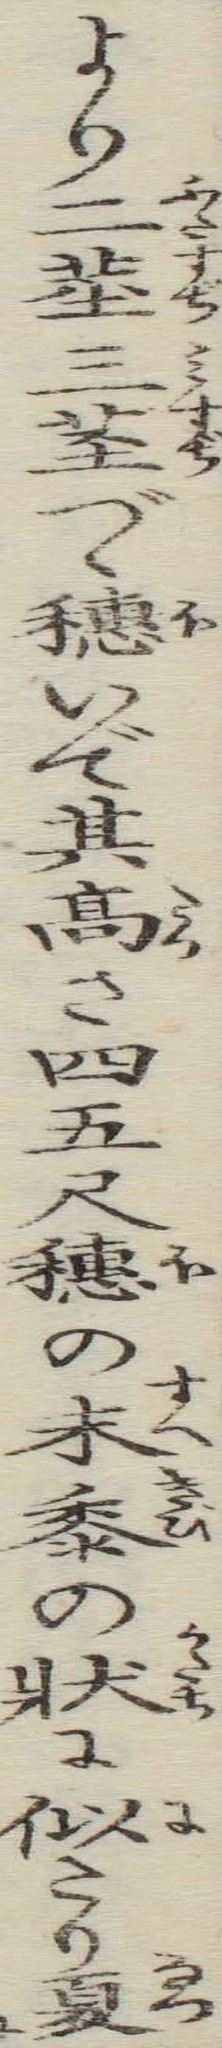より二茎三茎づゝ穂いで其高さ四五尺穂の末黍の状に似たり夏に
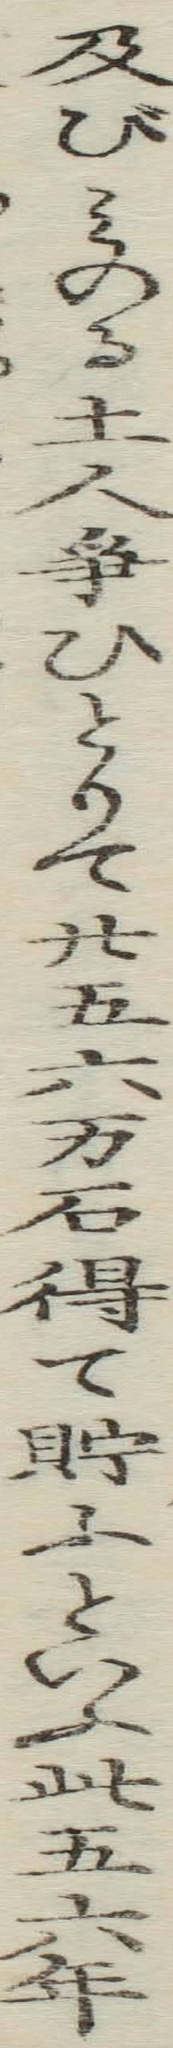及びみのる土人争ひとりて廿五六万石得て貯ふといふ此五六年
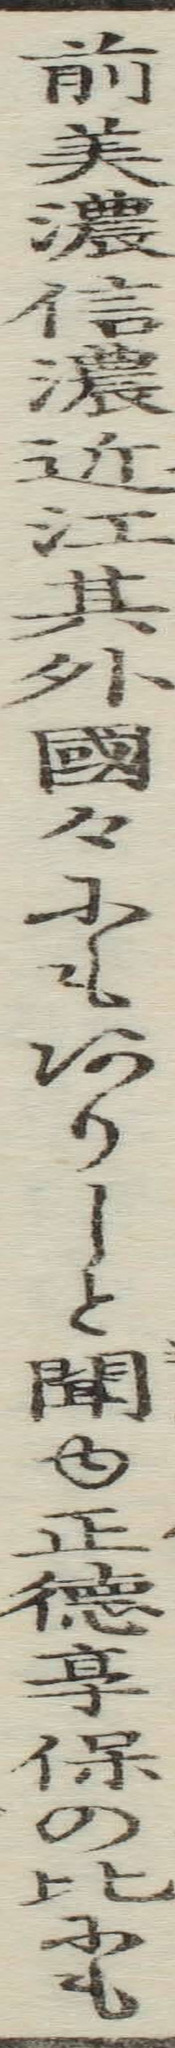前美濃信濃近江其外国々にもありしと聞ゆ正徳享保の比にも
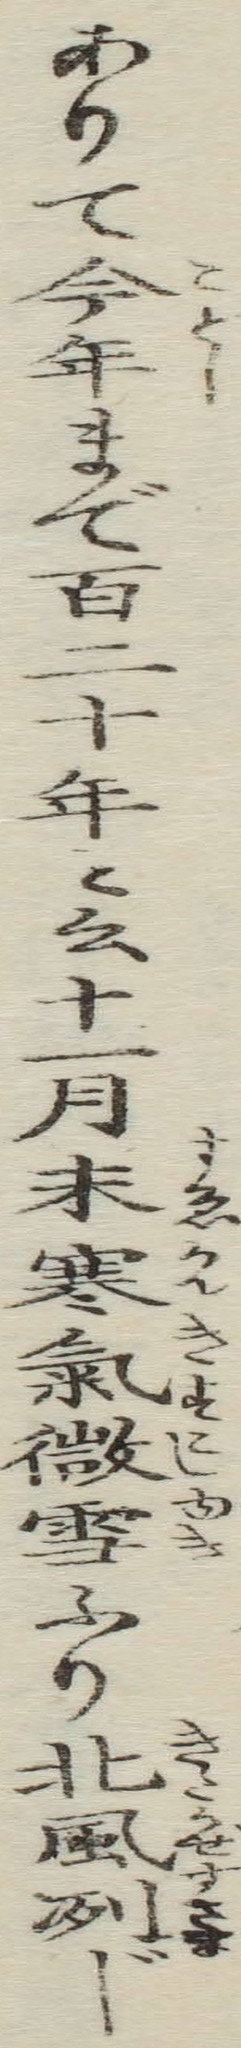ありて今年まで百二十年と云十一月末寒気微雪ふり北風冽じ
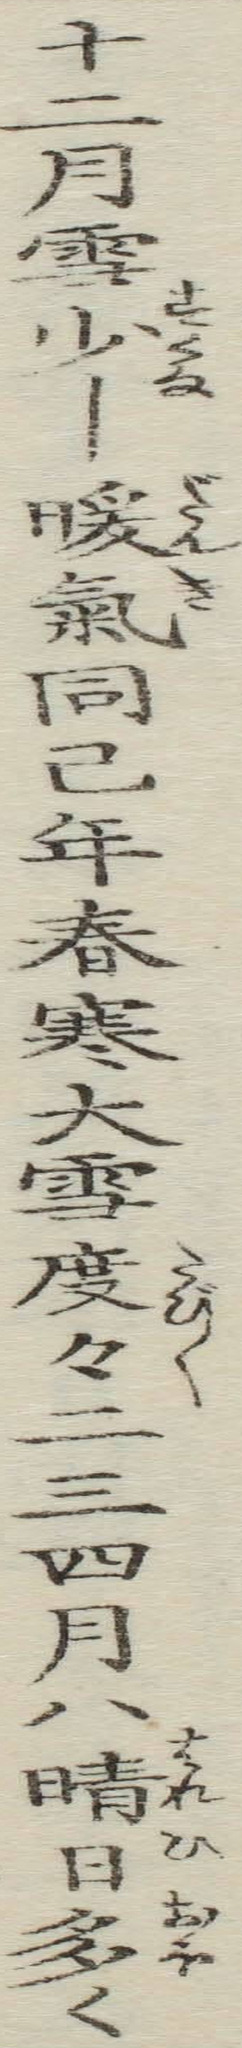十二月雪少し暖気同巳年春寒大雪度々二三四月は晴日多く
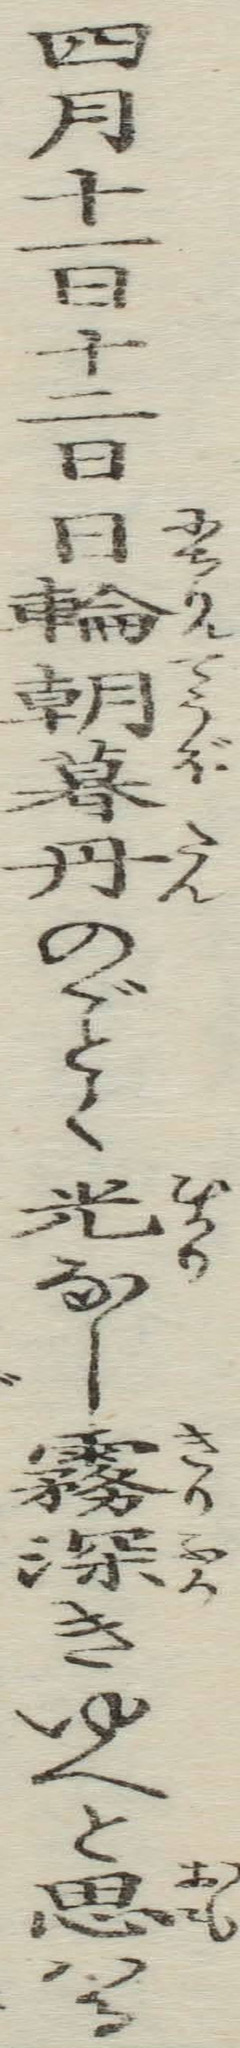四月十一日十二日日輪朝暮丹のごとく光なし霧深きゆへと思はる
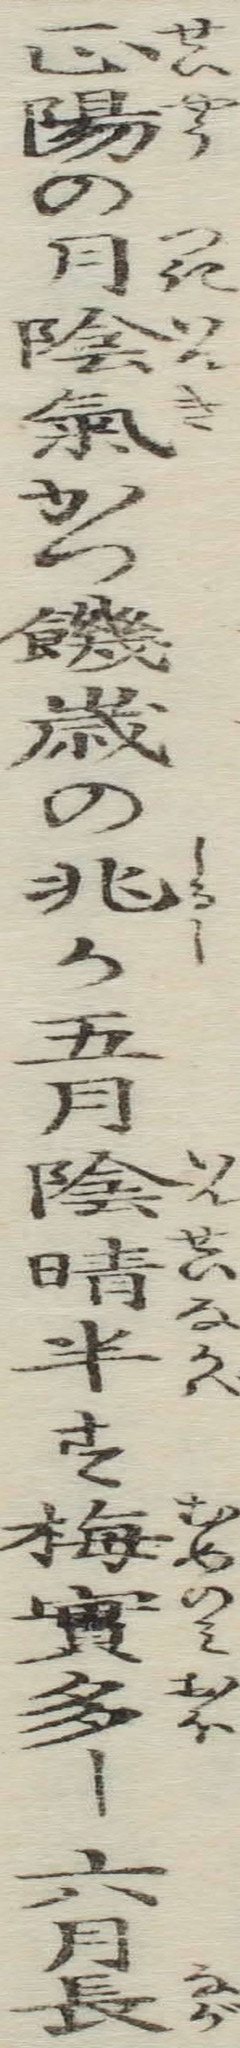正陽の月陰気かつ饑歳の兆か五月陰晴半す梅實多し六月長
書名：救荒便覧
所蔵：国文学研究資料館
